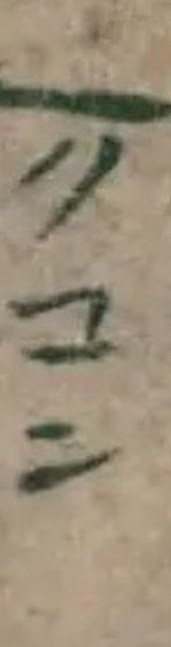クコン
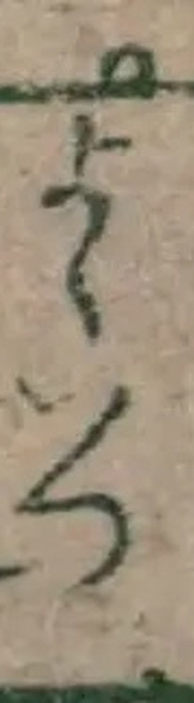よくいつ
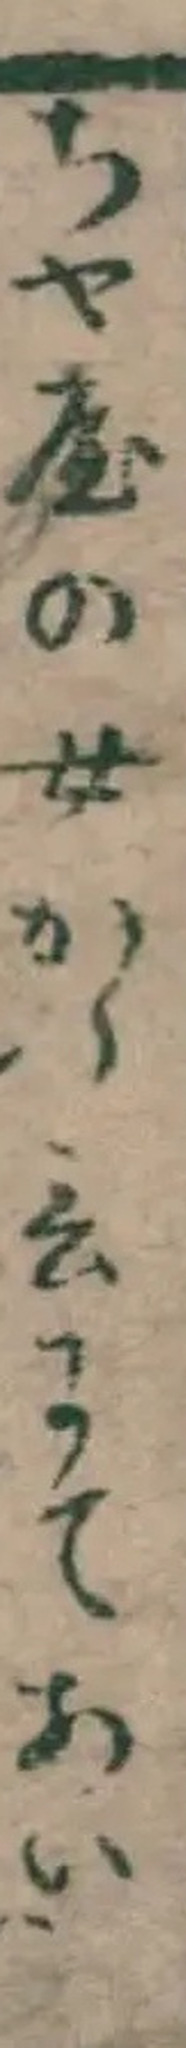ちや屋の女から言にてあい
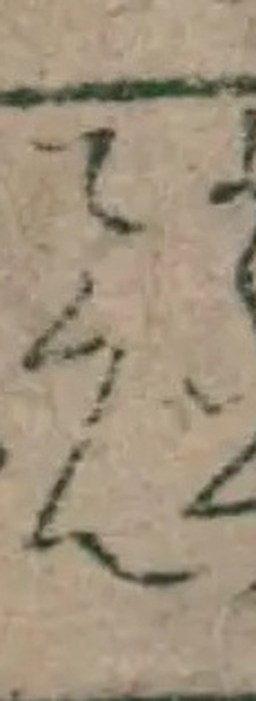てくん
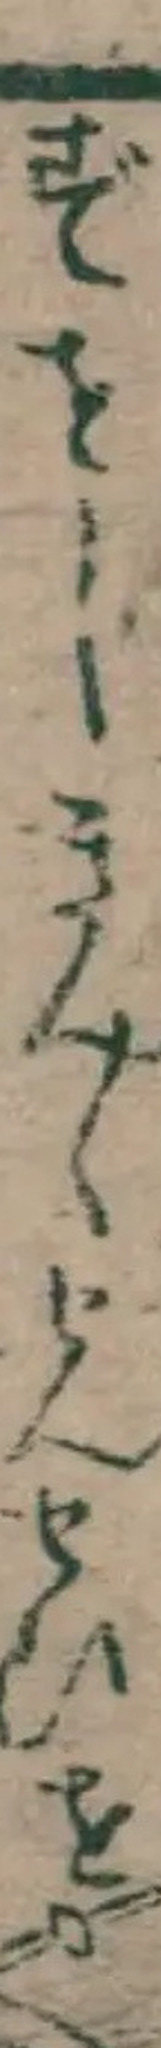ずをしきん〳〵せんせひを
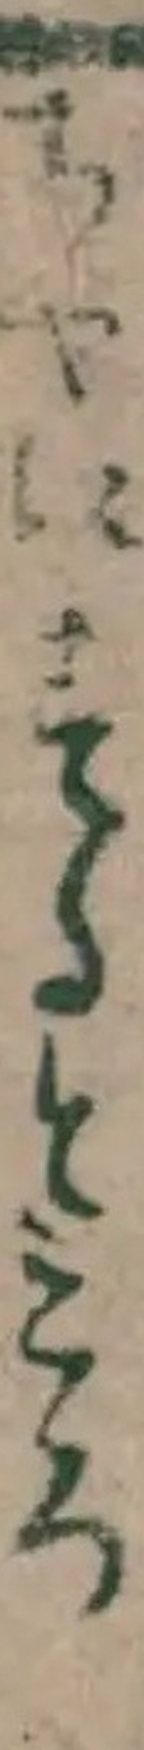ちやにするところ
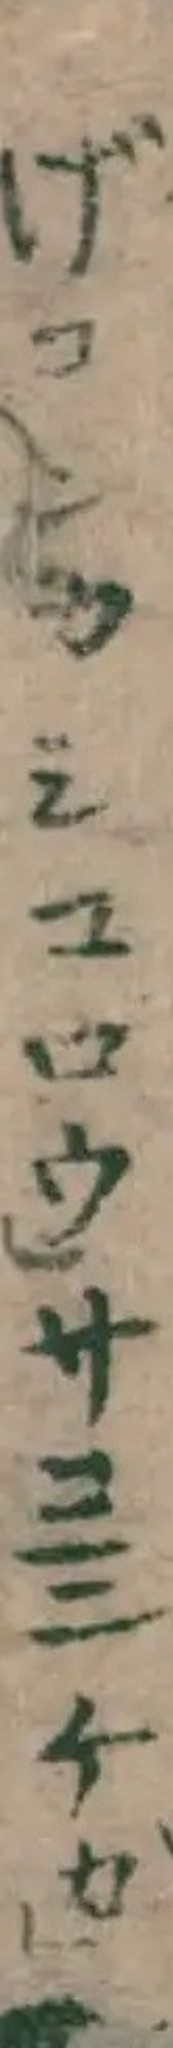げコンカシユロウサコ三ケガ
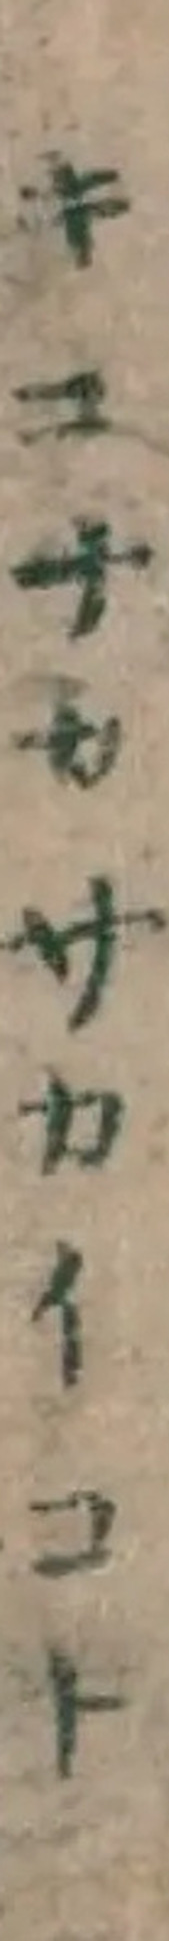キコナカサカイコト
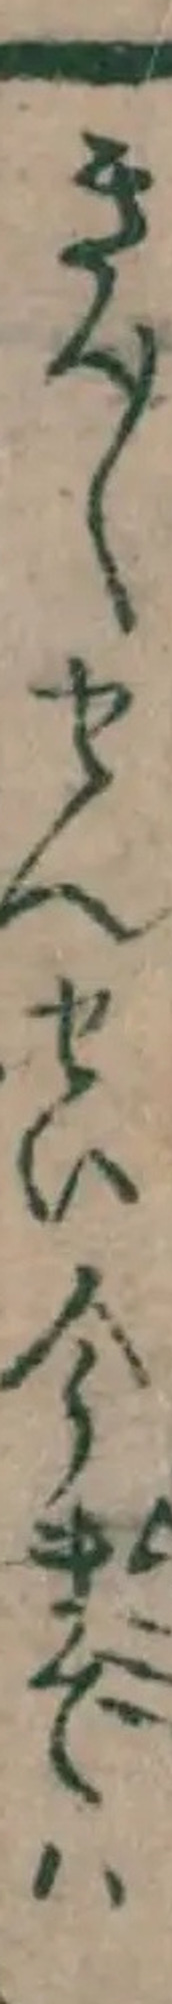きん〳〵せんせい今まては
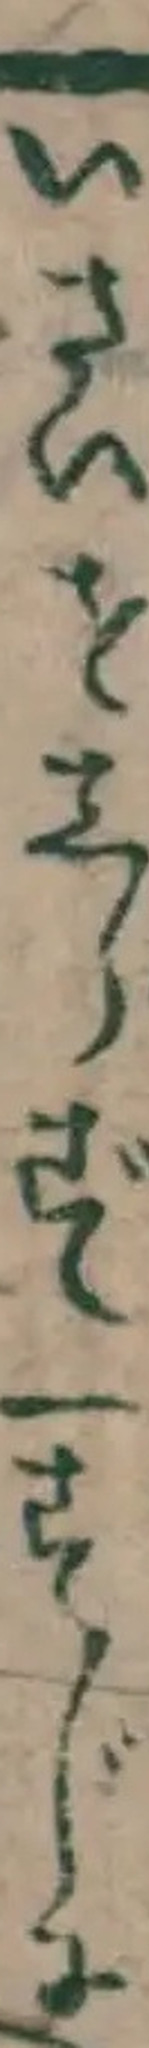いさいをしらず一すじに
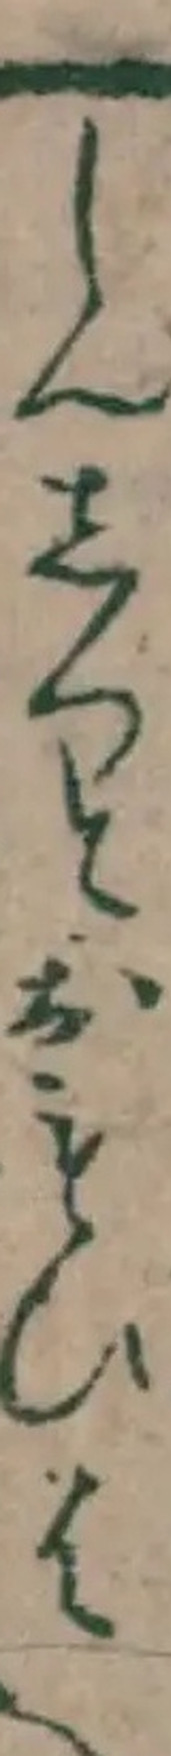しんしつとおもひは
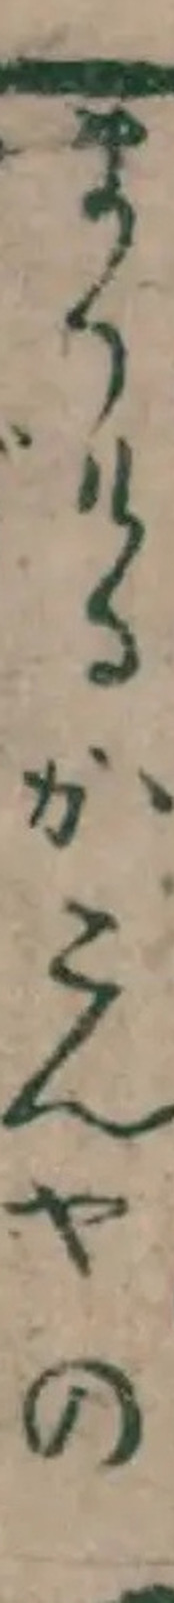まりけるかこんやの
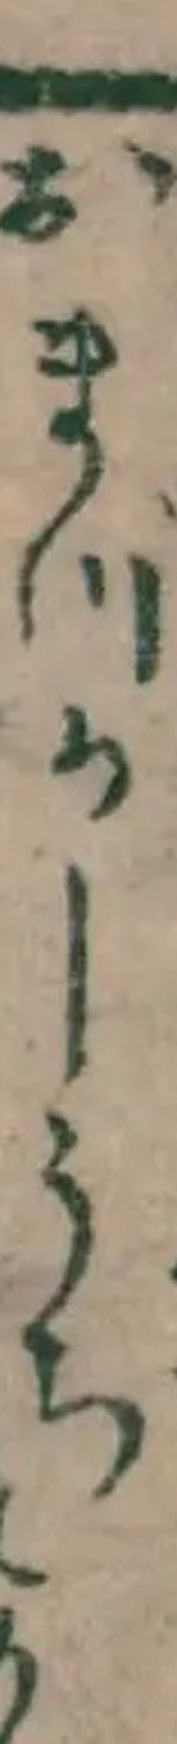おまづかしうちとかく
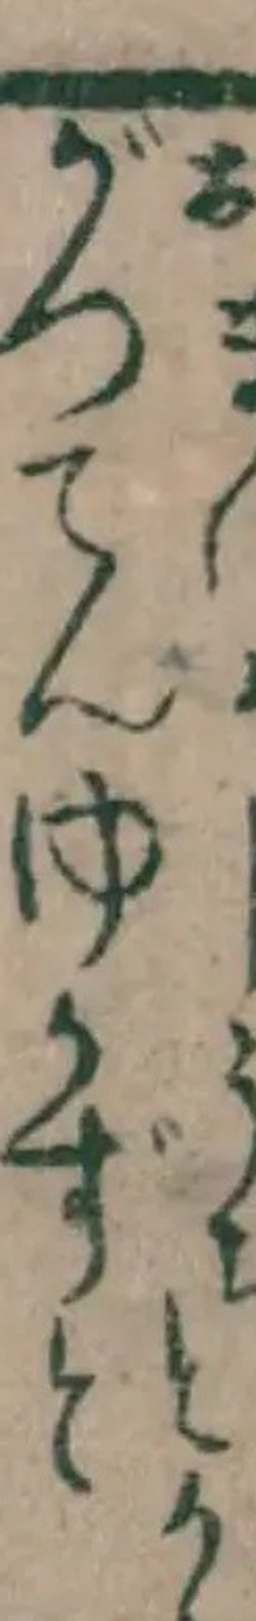がつてんゆかずと
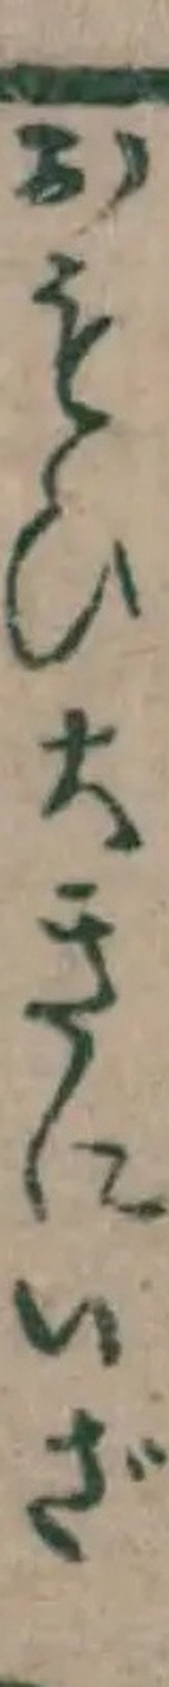おもひ大きにいざ
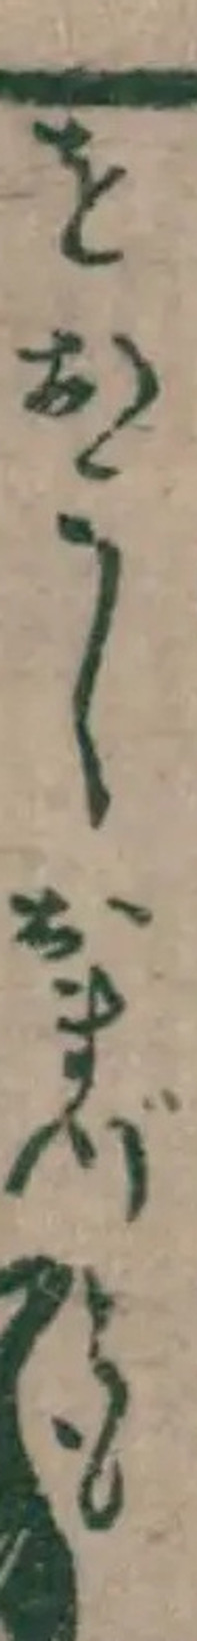をおこしおまづとも
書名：金々先生栄花夢 : 2巻
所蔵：国立国会図書館 National Diet Library, JAPAN
